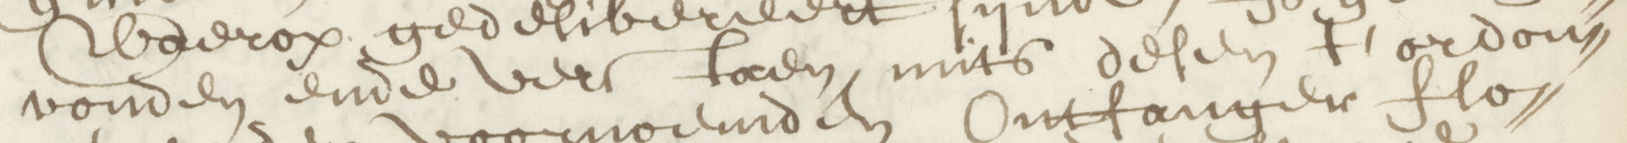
vonden ende verstaen, mits desen t'ordon,,
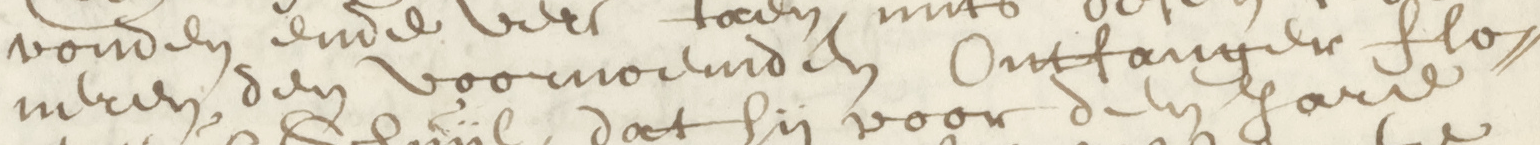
neren, den voornoemden Ontfanger Flo,,
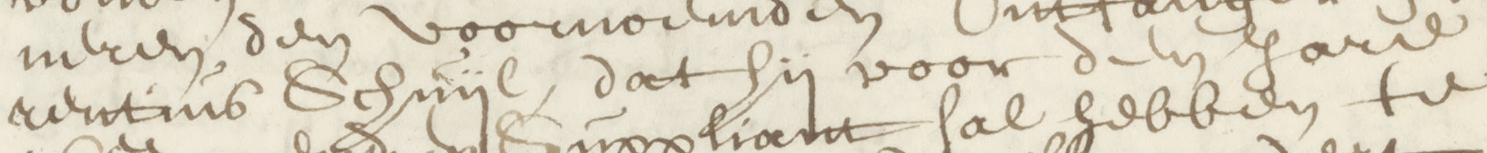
rentius Schuijl, dat hij voor den Jare
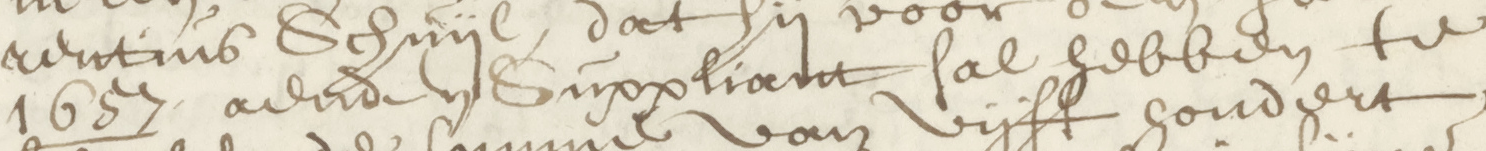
1657 aenden Suppliant sal hebben te
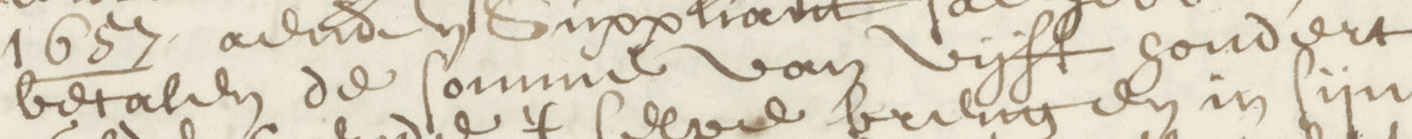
betalen de somme van vijff hondert
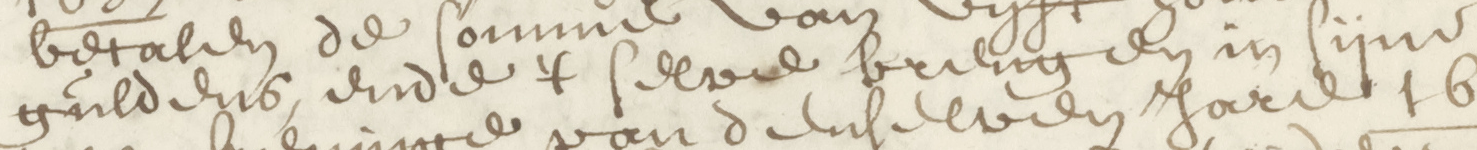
guldens, ende 't selve brengen in sijne
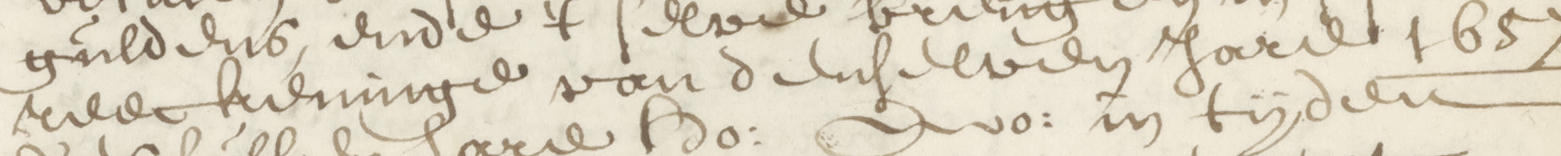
reeckeninge van denselven Jare 1657.
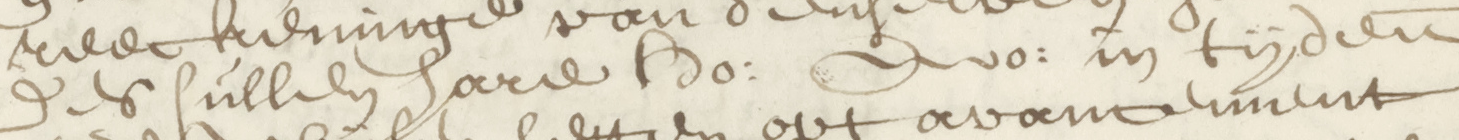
Des sullen hare Ho:Mo: in tijden
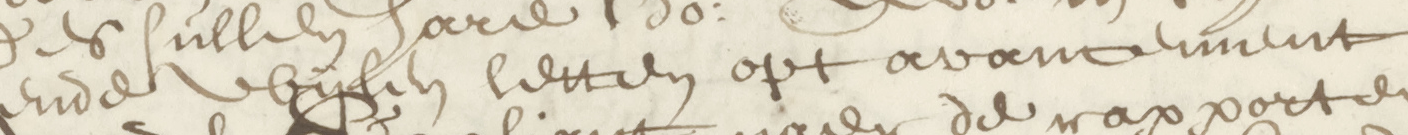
ende wijlen letten opt avancement
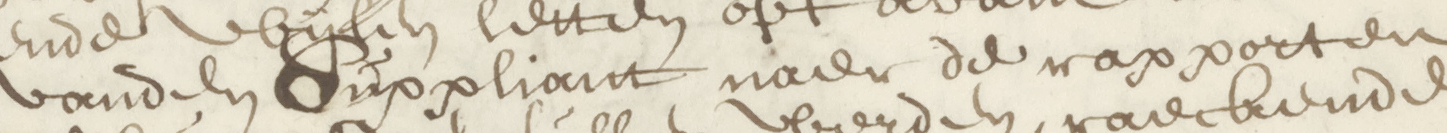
vanden Suppliant naer de rapporten
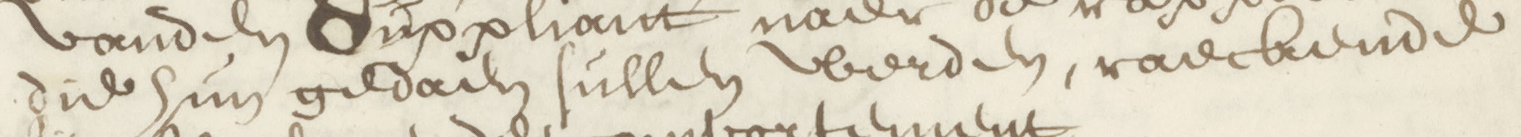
die hun gedaen sullen werden, raeckende
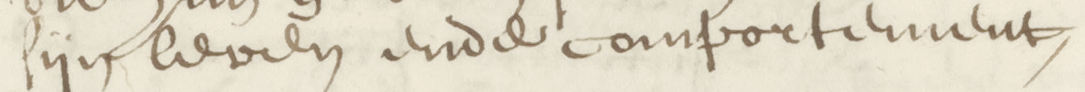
sijn leven ende comportement.
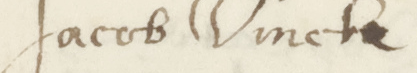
Jacob Vinck
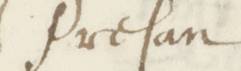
Presan
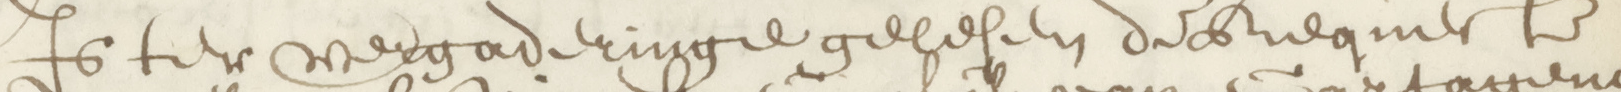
Is ter vergaderinge gelesen de Requeste
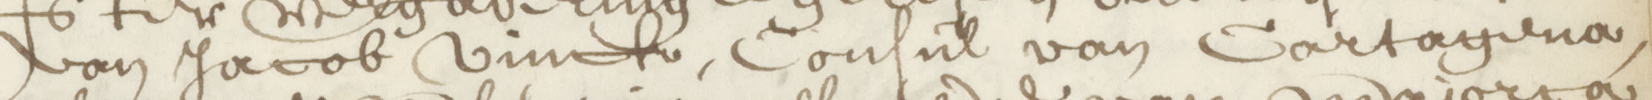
van Jacob Vinck, Consul van Cartagena,
